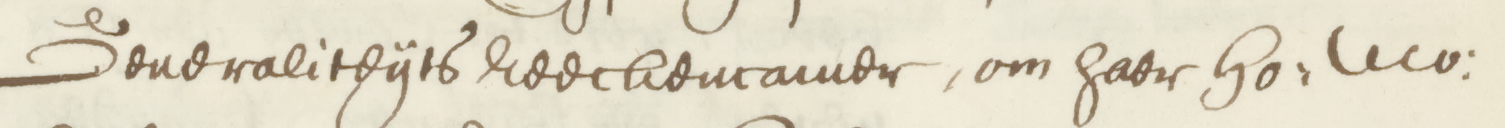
Generaliteijts reeckencamer, om haer Ho:Mo:
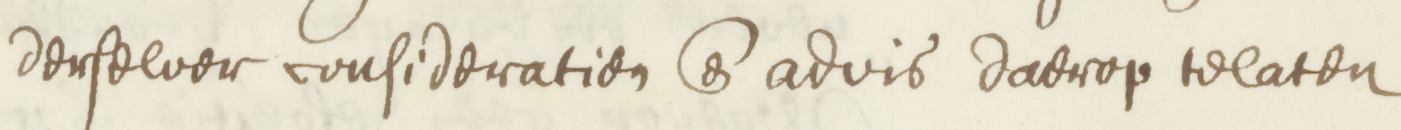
derselver consideratien & advis daerop te laten
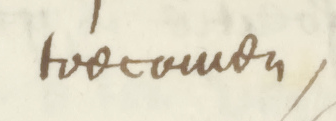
toecomen.
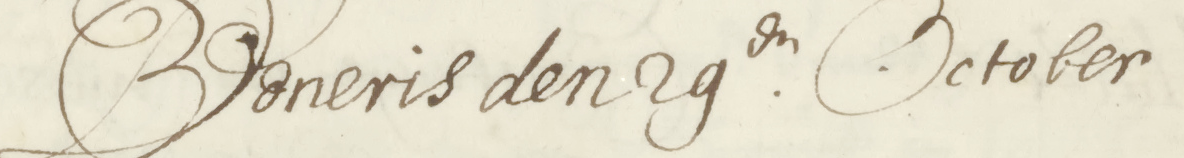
Veneris den 29en October
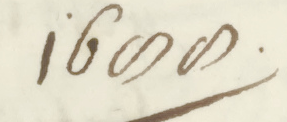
1688.
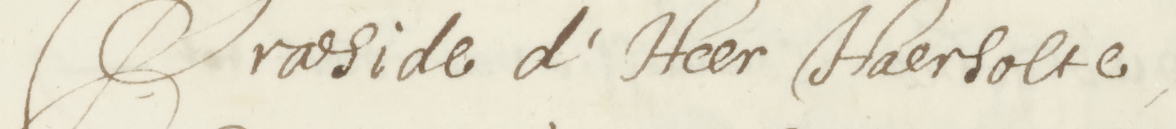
Præside d' Heer Haersolte
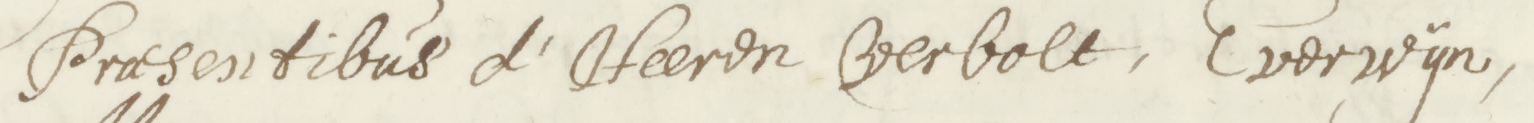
Præsentibus d' Heeren Verbolt, Everwijn,
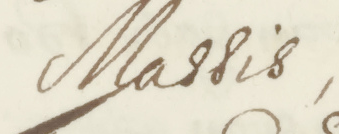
Massis
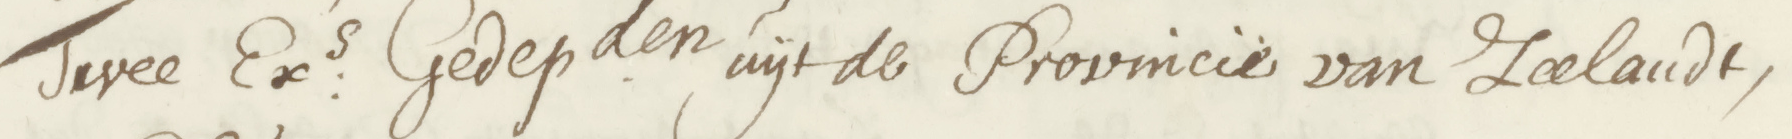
Twee Exs. Gedepden uijt de Provincie van Zeelandt,
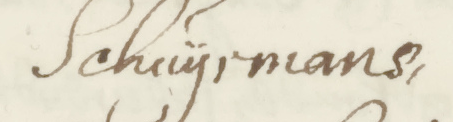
Schuijrmans,
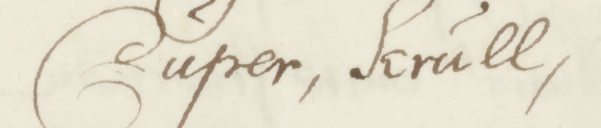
Cuper, Krull.
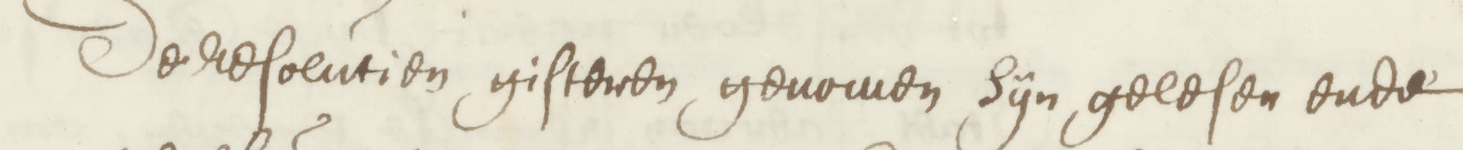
De resolutien gisteren genomen sijn gelesen ende
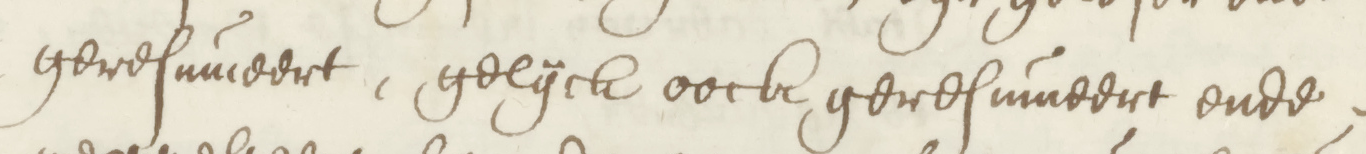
geresumeert, gelijck oock geresumeert ende
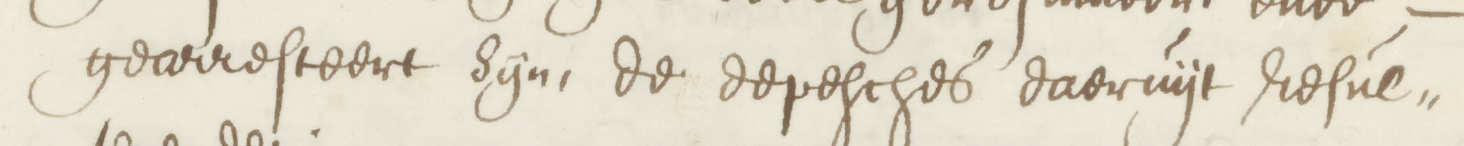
gearresteert sijn, de depesches daeruijt resul„
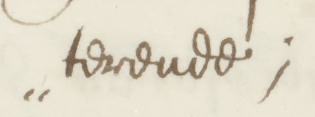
terende;
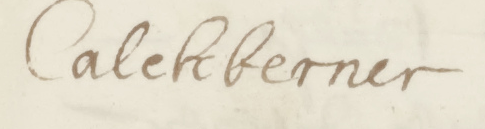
Calckberner
